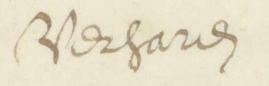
Verharen
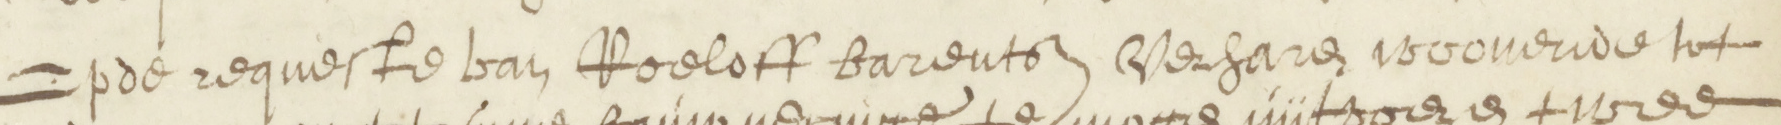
Opde requeste van Roeloff Barents Verharen woonende tot
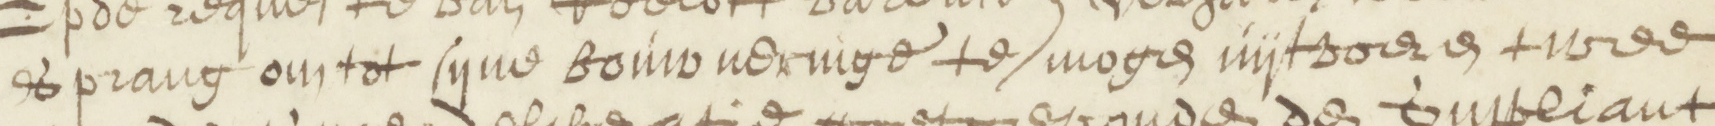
Spang om tot syne bouwneringe te mogen uijtvoeren twee
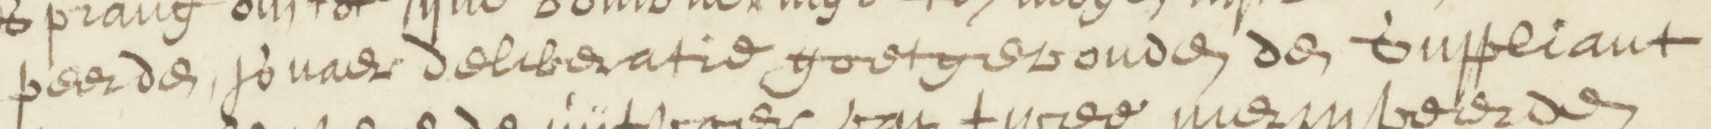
peerden, is naer deliberatie goegevonden den Suppliant
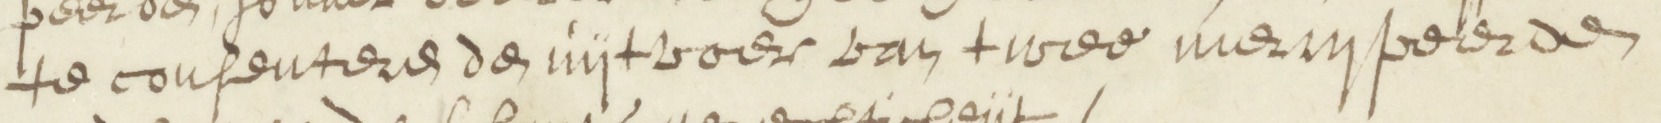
te consenteren den uijtvoer van twee merrypeerden
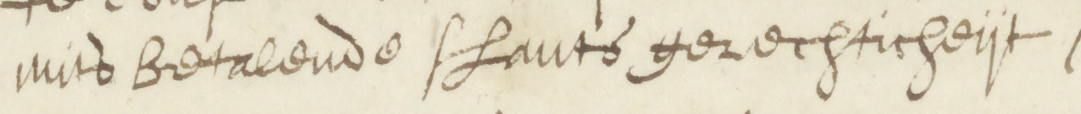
mits betalende sLants gerechticheijt.
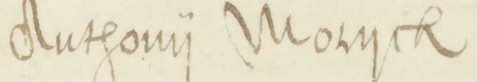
Anthonij Moryck
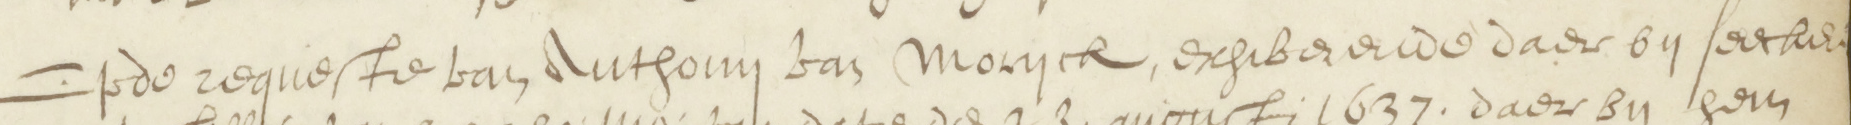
Opde requeste van Anthony van Moryck, exhiberende daer by seecker
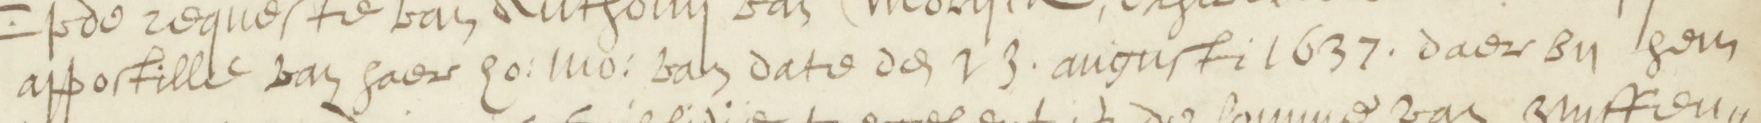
appostille van haer ho:Mo: van date den 13. augustus 1637. daer by hem
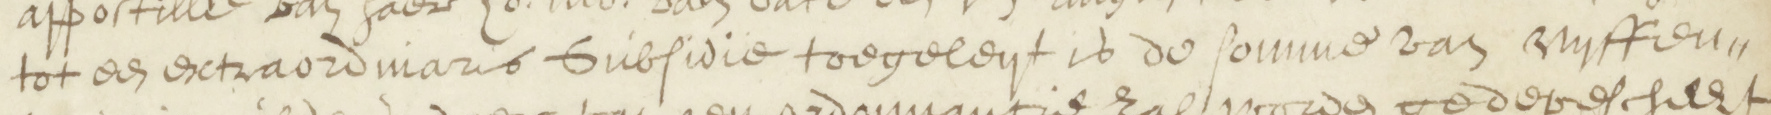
tot een extraordinaris Subsidie toegeleyt is de somme van vyffen„
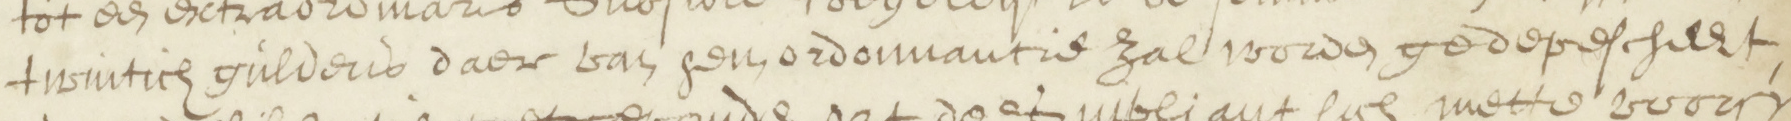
twintich guldens daer van hem ordonnantie zal worden gedepescheert,
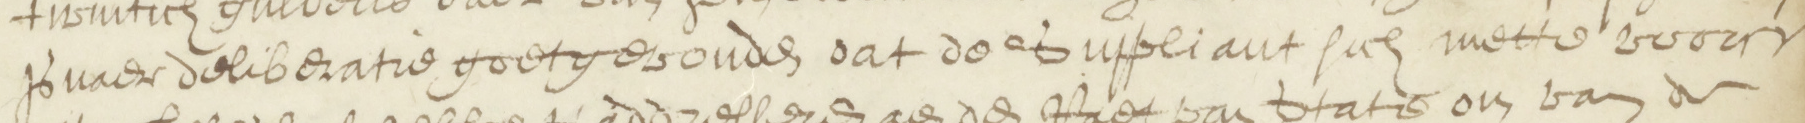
is naer deliberatie goetgevonden dat de Suppliant sich mette voors
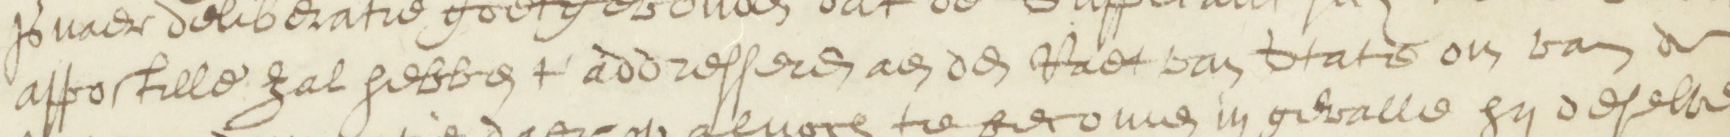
appostille zal hebben t‛addresseren aen den Raet van State om van de
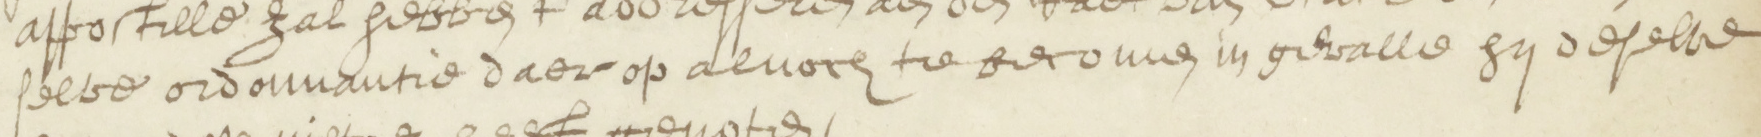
selve ordonnantie daer op alnoch te becomen in gevalle hy deselve
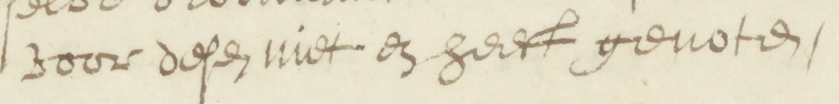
voor desen niet en heeft genoten.
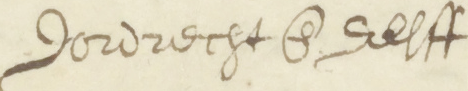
Dordrecht & Delff
